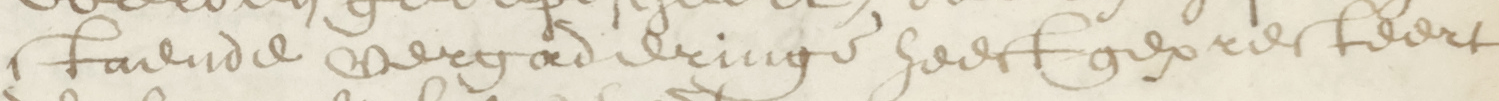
staende vergaderinge heeft gepresteert
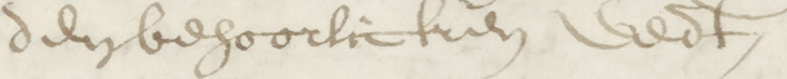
den behoorlicken Eedt.
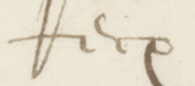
Recx
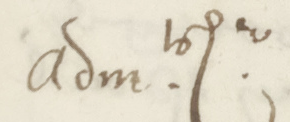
admtshr.
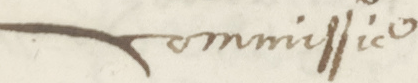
commissie
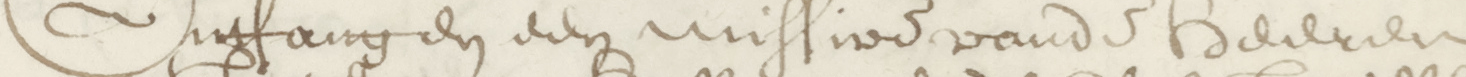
Ontfangen een missive vande Heeren
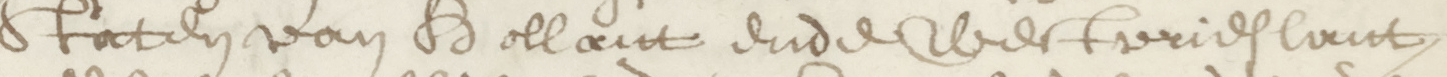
Staten van Hollant ende Westvrieslant,
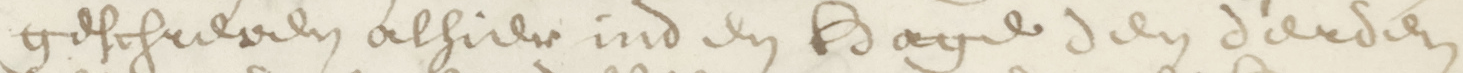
geschreven alhier inden Hage den derden
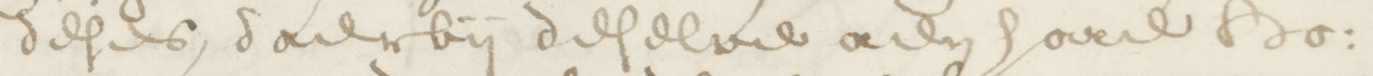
deses, daerbij deselve aen hare Ho:
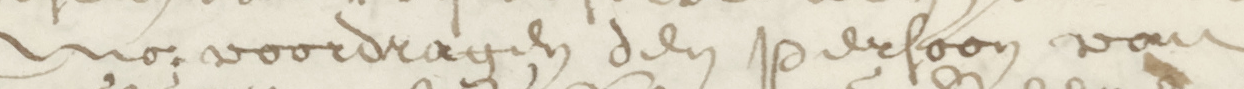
Mo: voordragen, den persoon van
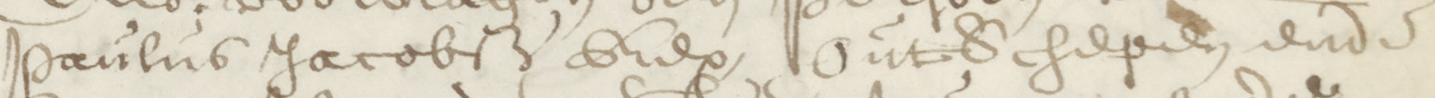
Paulus Jacobsz Rex, outSchepen ende
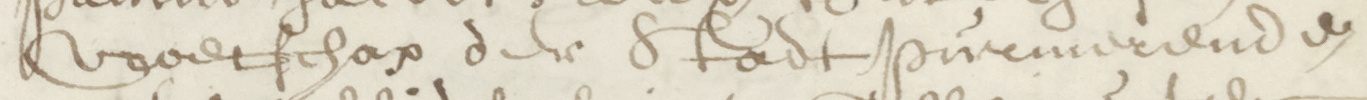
vroetschap der Stadt Purmerende,
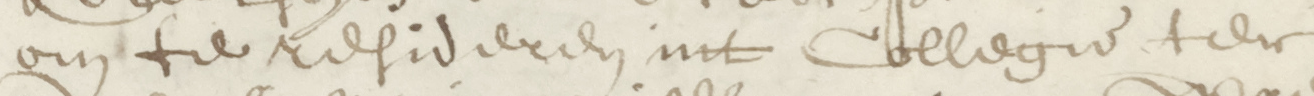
om te resideren int Collegie ter
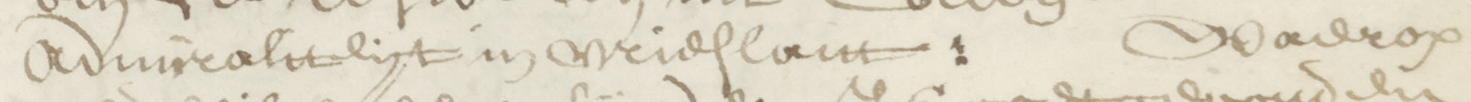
Admiraliteijt in vrieslant: Waerop
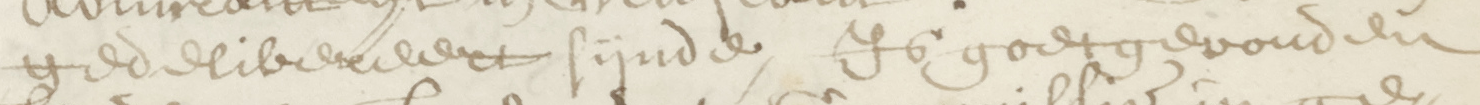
gedelibereert sijnde, Is goetgevonden
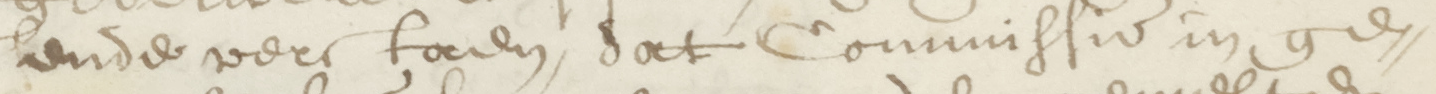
ende verstaen, dat Commissie in ge,,
